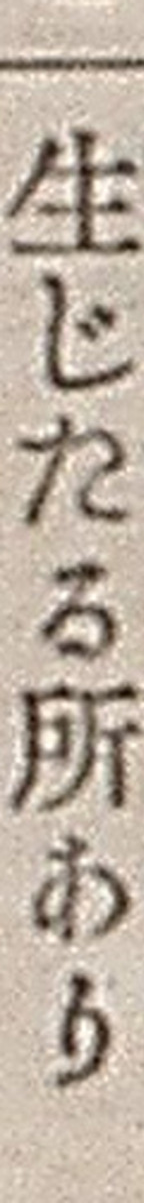生じたる所あり
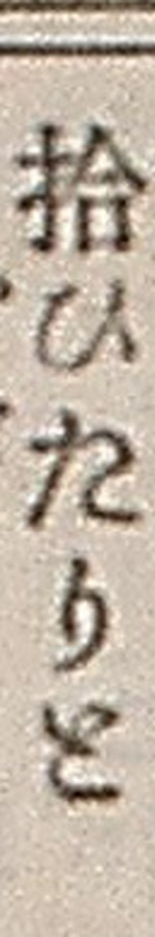拾ひたりと
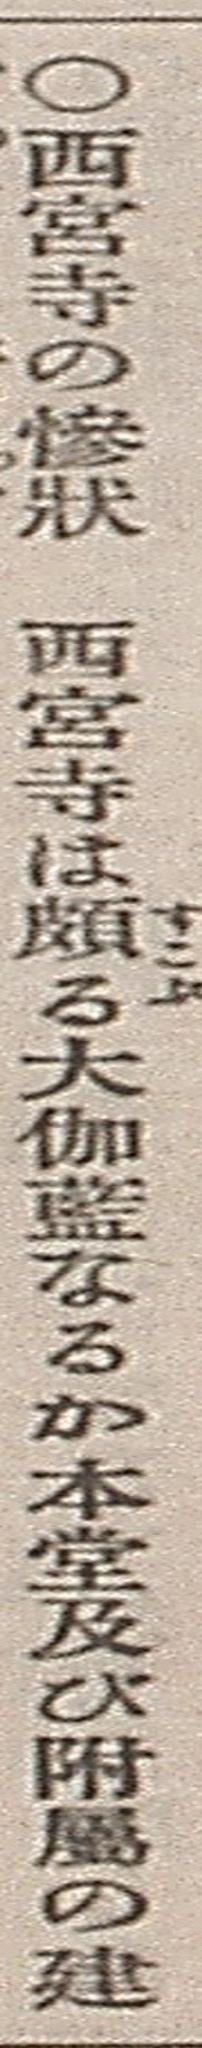〇西宮寺の惨状西宮寺は頗る大伽藍なるか本堂及び附属の建
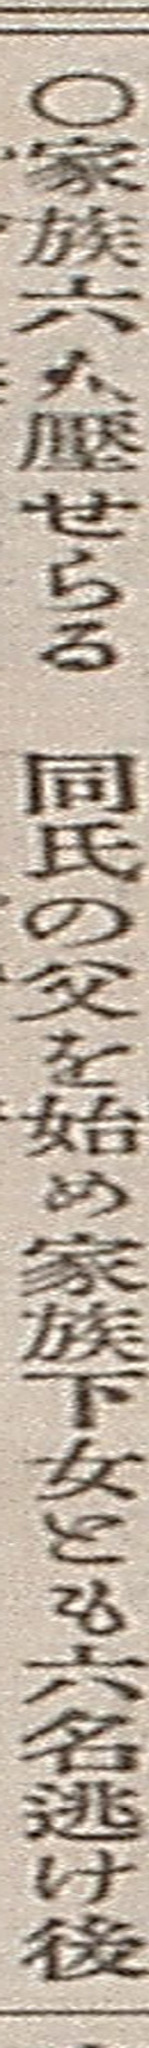〇家族六人圧せらる同氏の父を始め家族下女とも六名逃け後
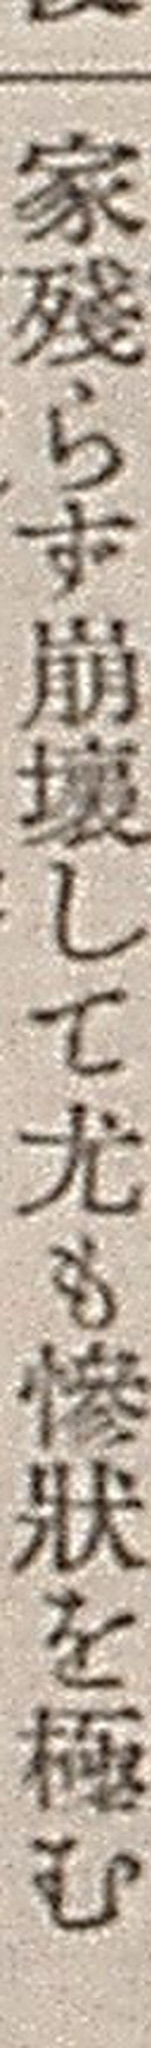家残らず崩壊して尤も惨状を極む
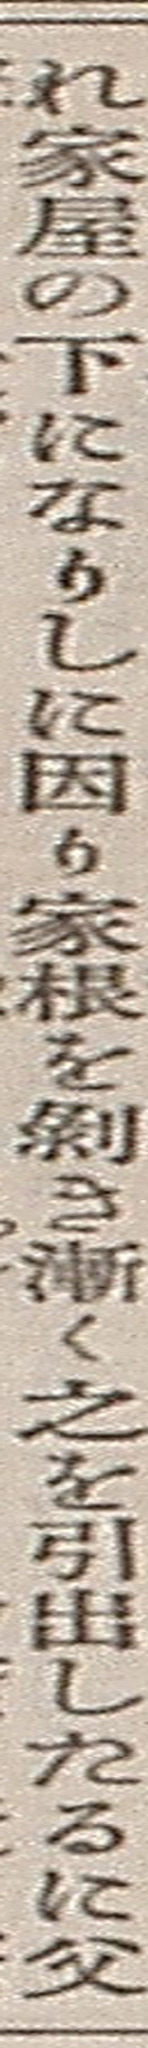れ家屋の下になりしに因り家根を剥き漸く之を引出したるに父
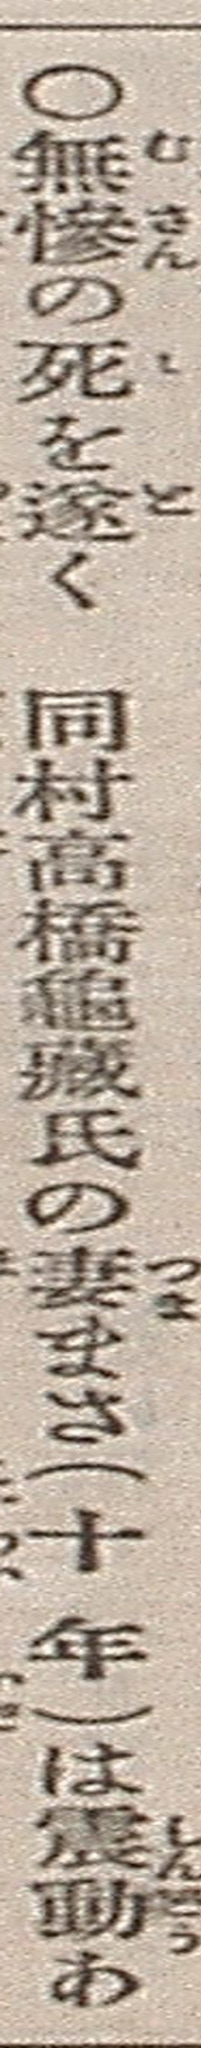〇無惨の死を遂く同村高橋亀蔵氏の妻まさは震動あ
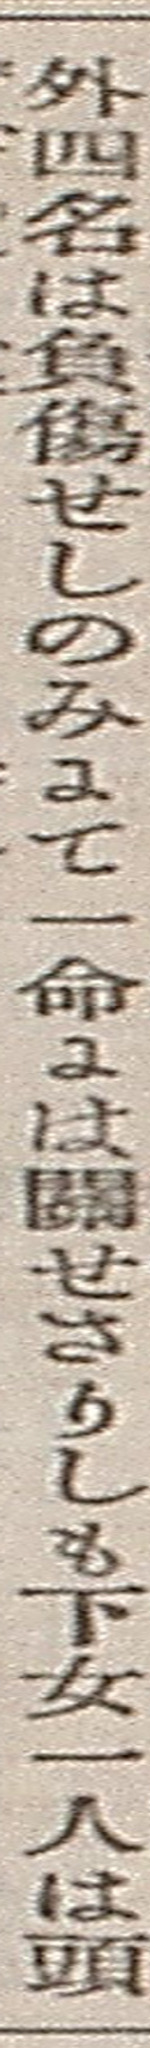外四名は負傷せしのみにて一命には関せさりしも下女一人は頭
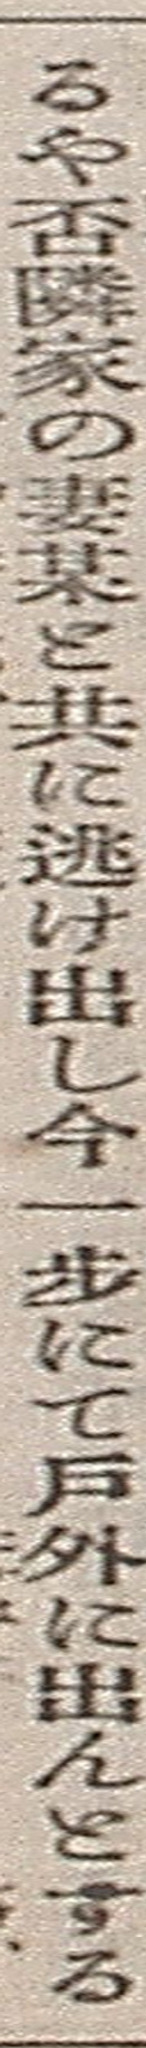るや否隣家の妻某と共に逃け出し今一歩にて戸外に出んとする
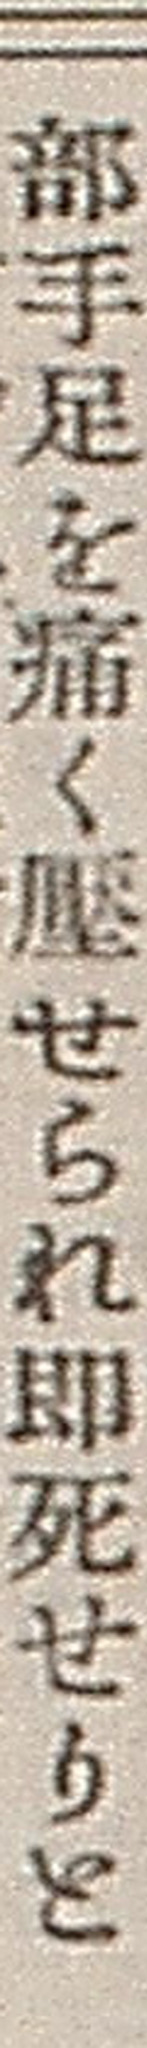部手足を痛く圧せられ即死せりと
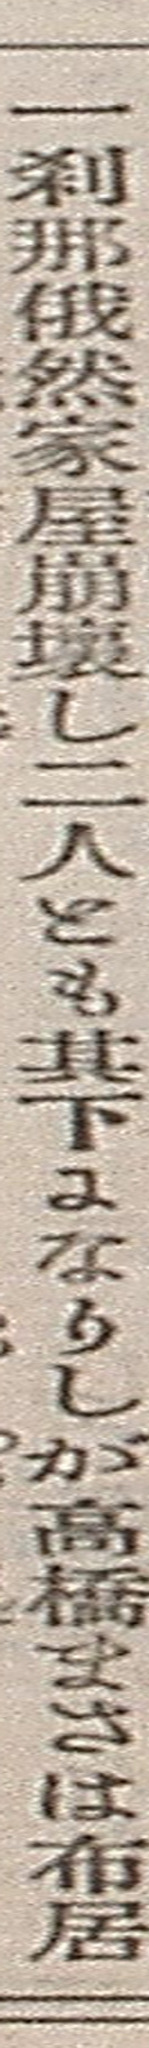一刹那俄然家屋崩壊しニ人とも其下になりしが高橋まさは布居
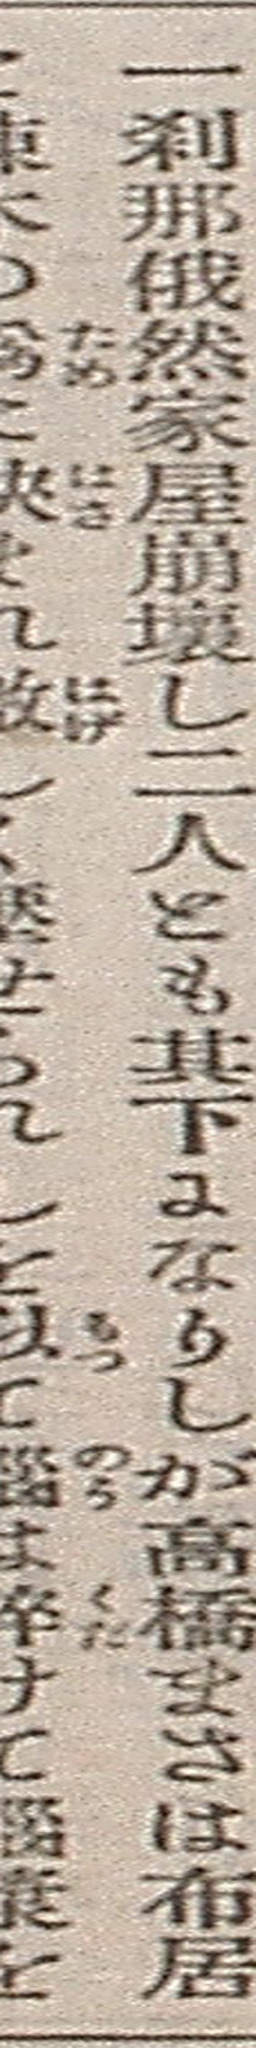と棟木の為に挟まれ激しく圧せられしを以て脳は砕けて脳漿を
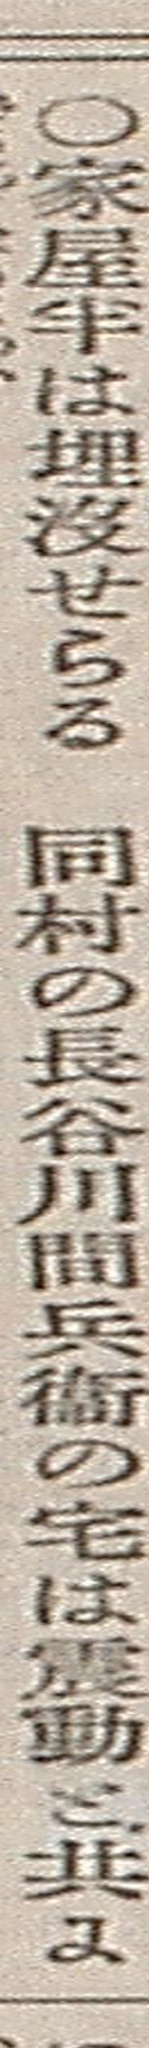〇家屋半は埋没せらる同村の長谷川間兵衛の宅は震動と共に
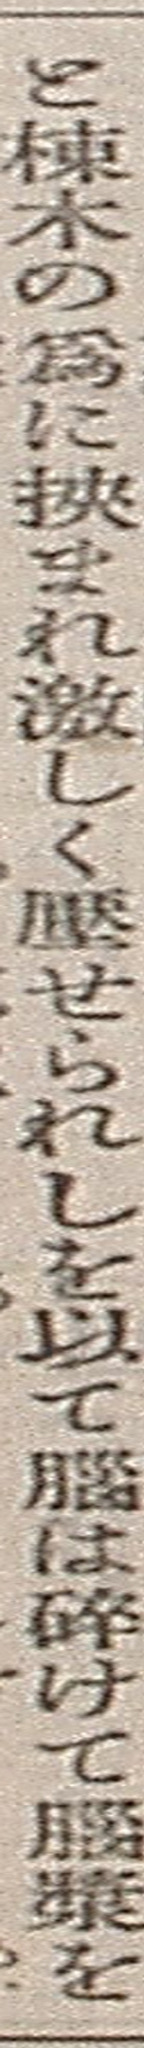と棟木の為に挟まれ激しく圧せられしを以て脳は砕けて脳漿を
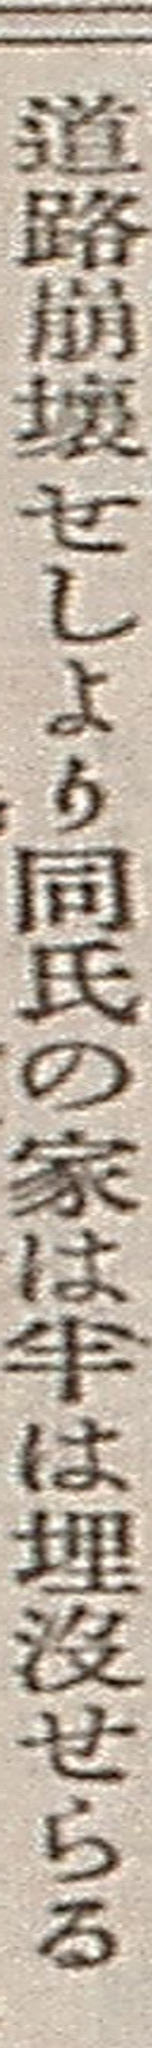道路崩壊せしより同氏の家は半は埋没せらる
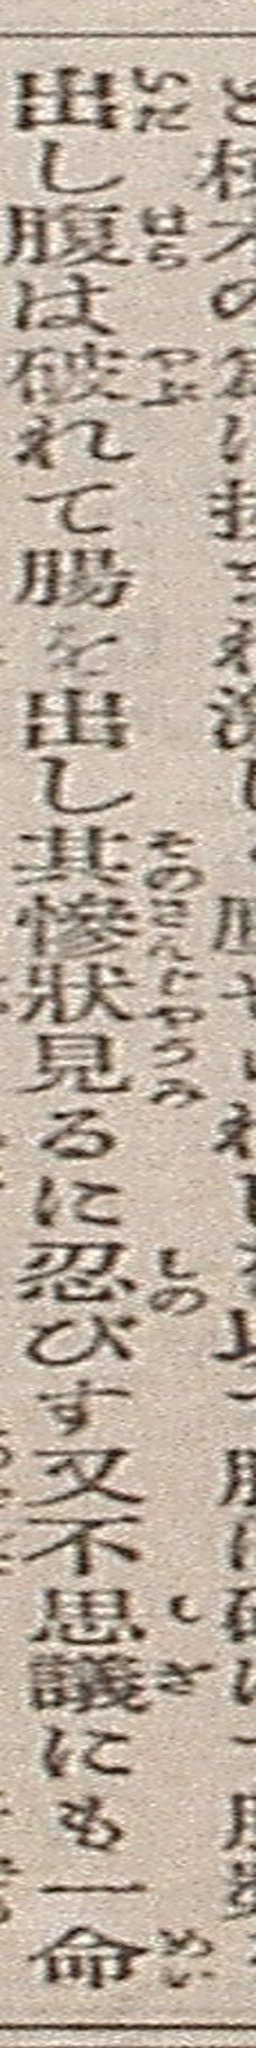出し腹は破れて腸を出し其惨状見るに忍びす又不思議にも一命
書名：風俗畫報臨時増刊第百二十四號　洪水地震被害録（上）
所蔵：東京大学地震研究所図書室 Earthquake Research Institute Library, The University of Tokyo, JAPAN
